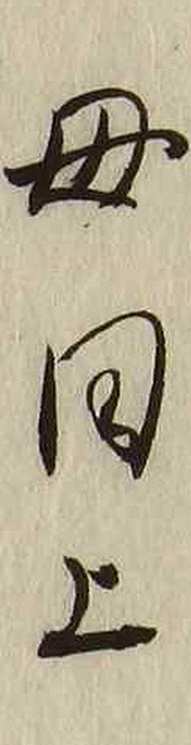母同上
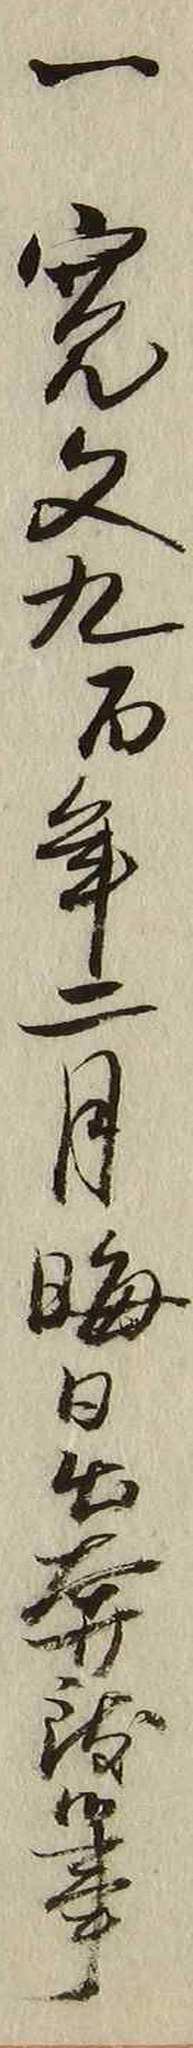一寛文九酉年二月晦日出奔致候筆
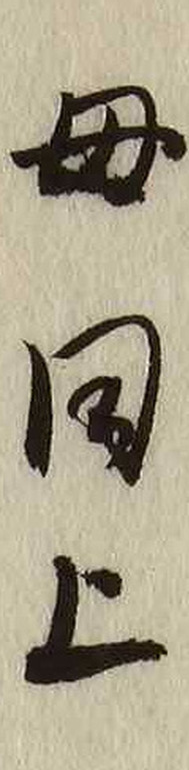母同上
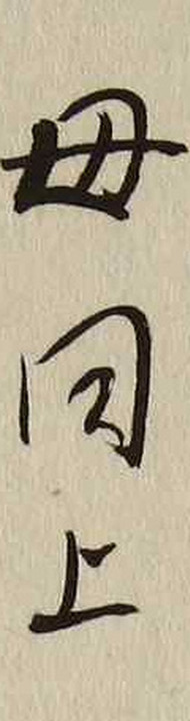母同上
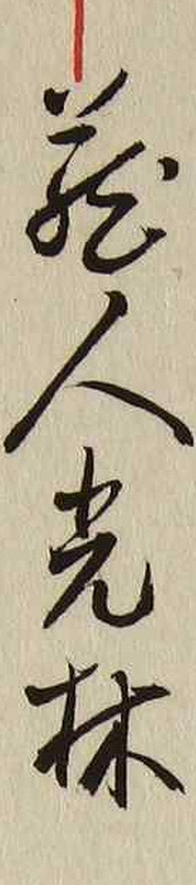蔵人光林
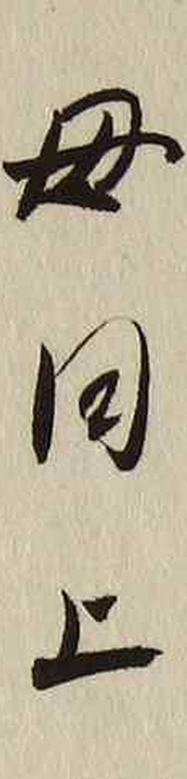母同上
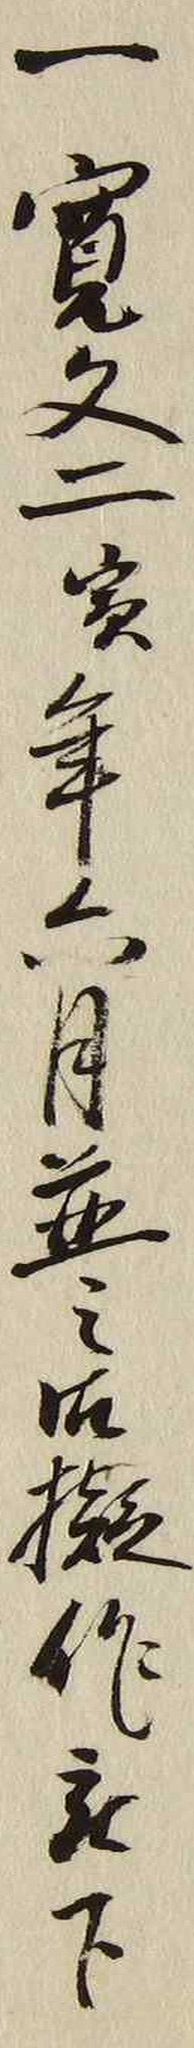一寛文二寅年六月並之御擬作被下
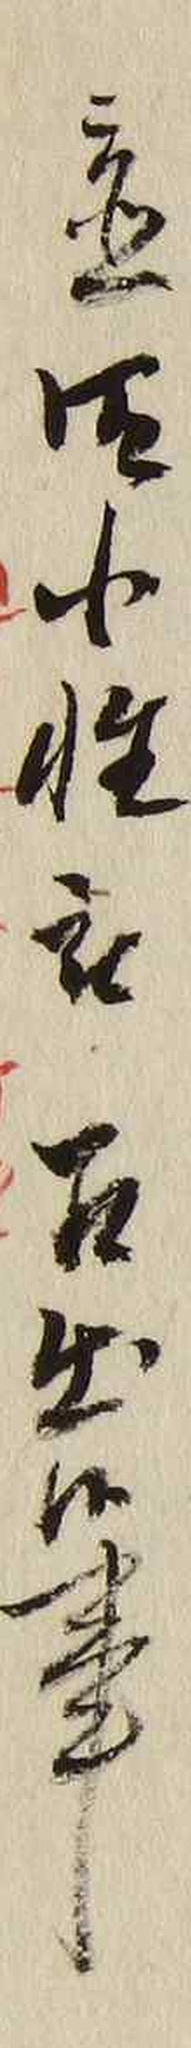置御小性被召出候事
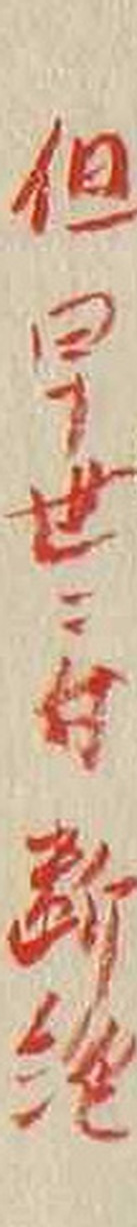但早世ニ付断絶

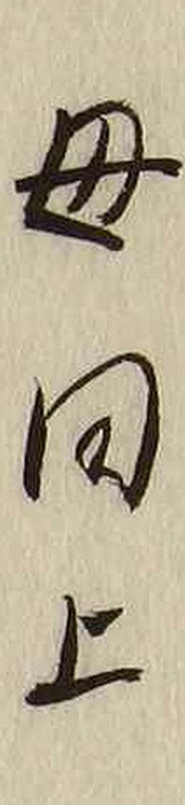母同上
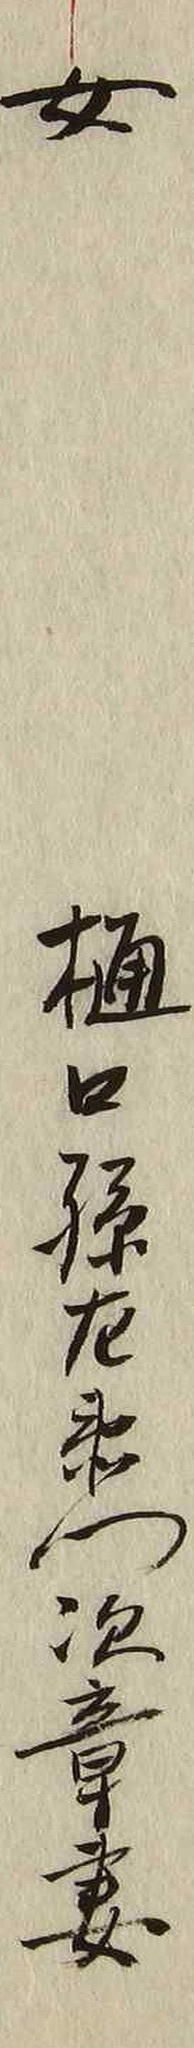女樋口孫左衛門次章妻
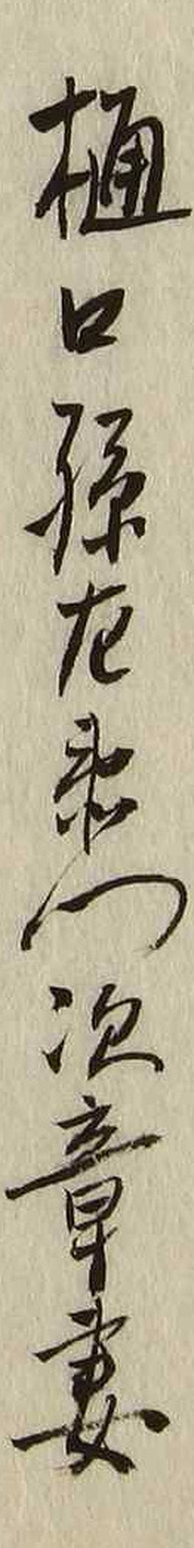女樋口孫左衛門次章妻
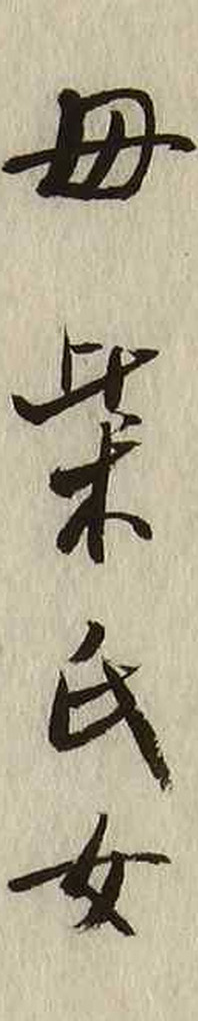母柴氏女
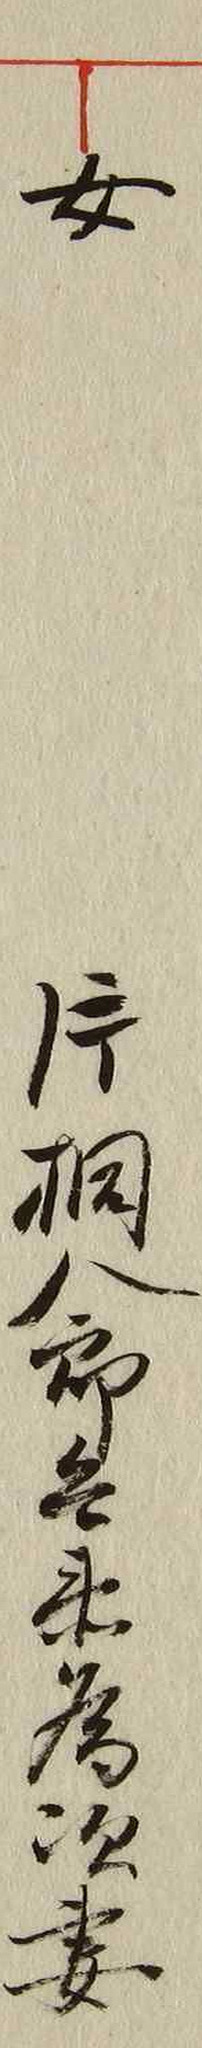女片桐八郎兵衛為次妻
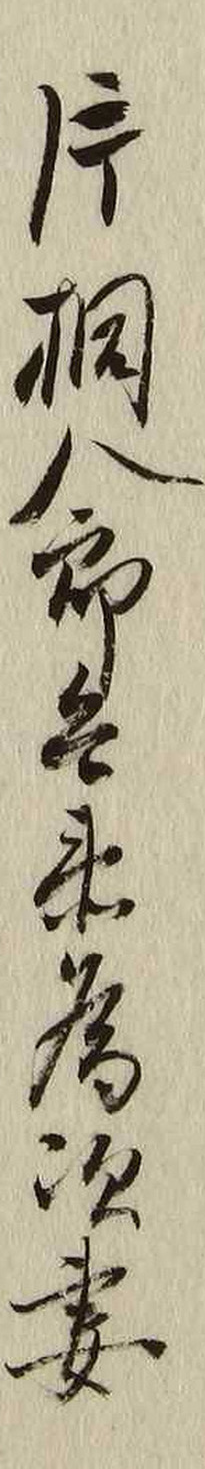女片桐八郎兵衛為次妻
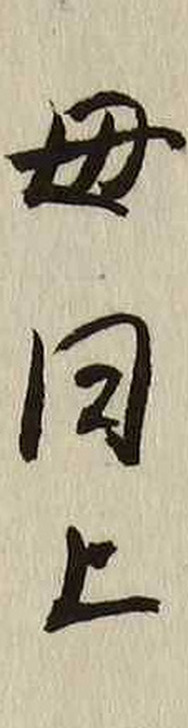母同上
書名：諸士系譜　巻之356　す之部6
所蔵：会津若松市立会津図書館
